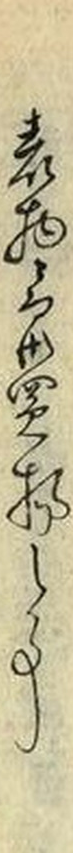表物ニ而御買揚之事
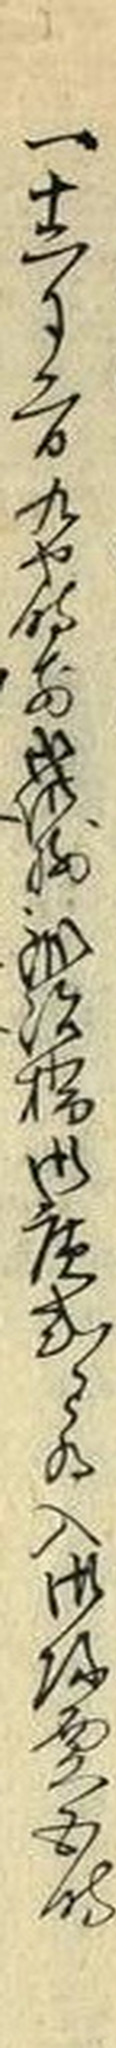一十二月二日九半時前御供揃鍛冶橋御広式へ被為入御帰殿五時
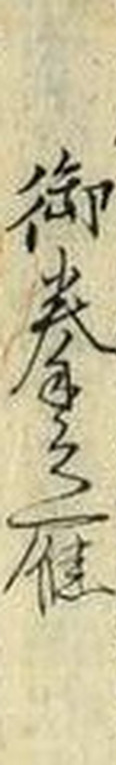御拳之雁
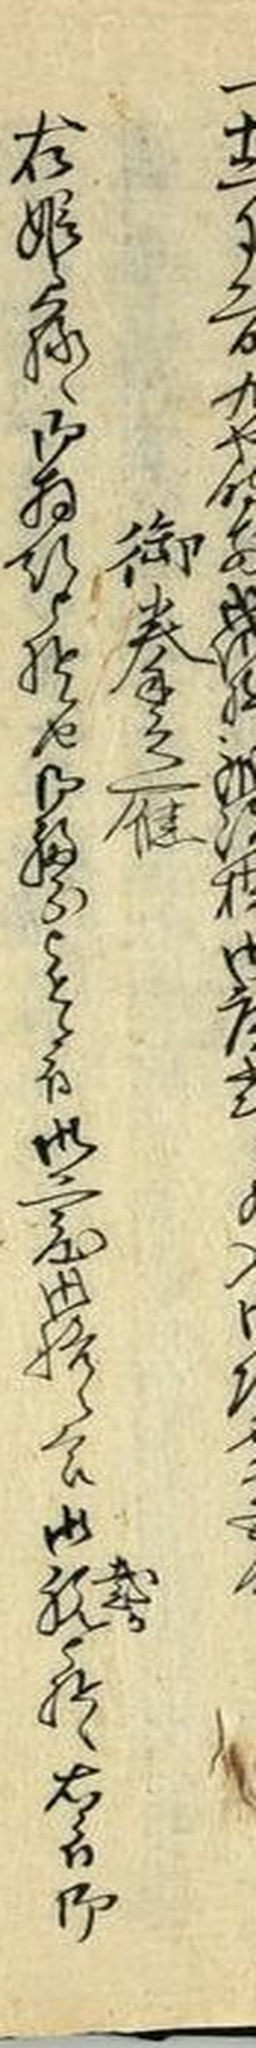右姫君様へ御拝領被遊候由御福分被進候ニ付御二度御膳之節御祝被遊候右ニ付御
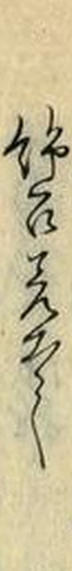飾台差出之
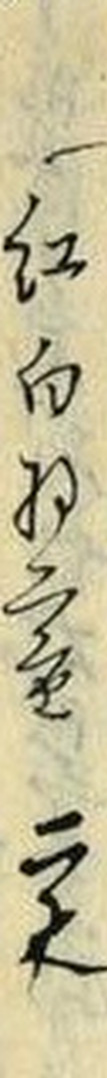紅白羽二重二疋
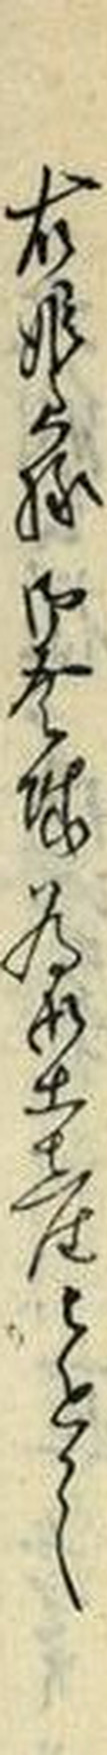右姫君様御登城為御土産被進之
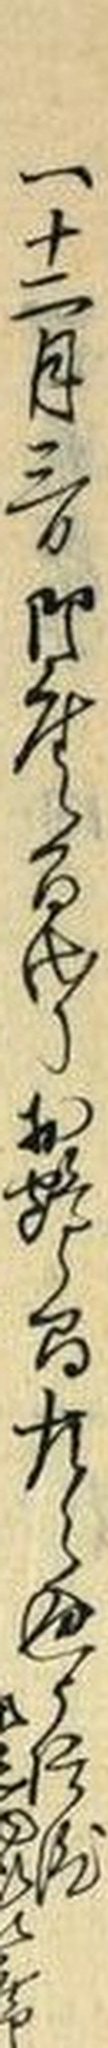一十二月三日御座之間代り於鶴之間左之通被仰渡
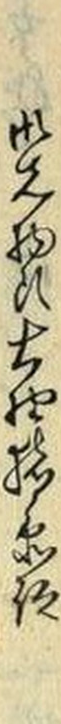御先物頭大野猪兵衛跡
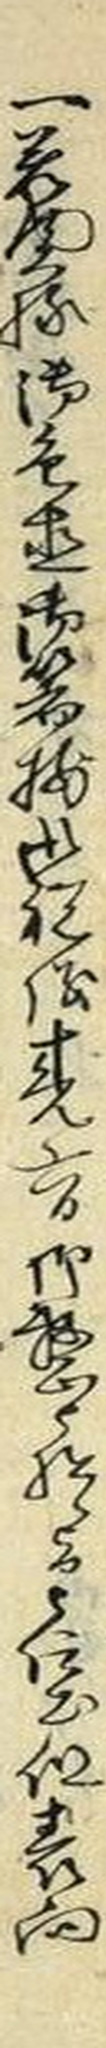一若殿様御色直御箸揃御祝儀来ㇽ六日御整被遊候旨被仰出但表向
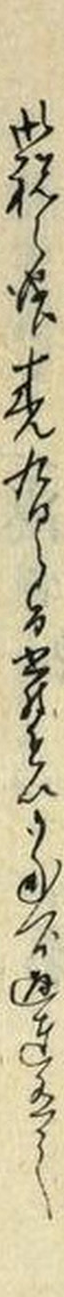御祝之儀ハ来ㇽ九日之旨書付を以御用人ゟ通達有之
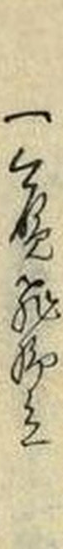一今晩飛脚立
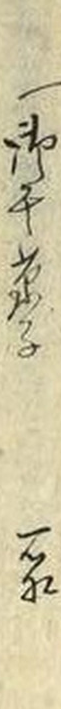御干菓子一箱
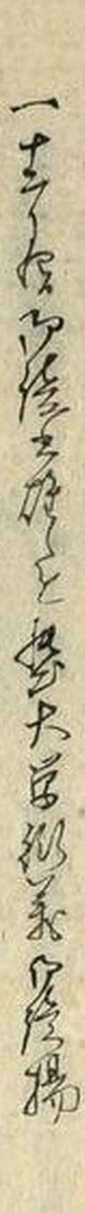一十二月四日御読書雄之進罷出大学徴義御読揚
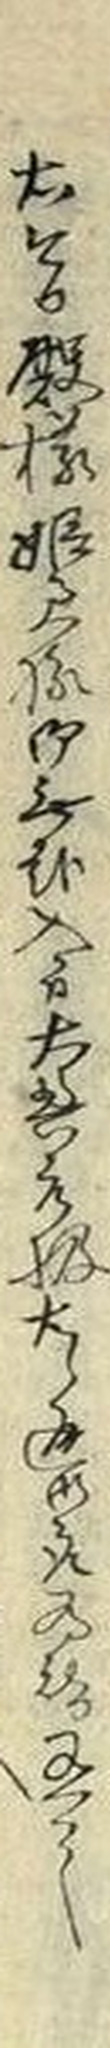右今日殿様姫君様御無卦入ニ付大奥取扱右之通御取為替有之
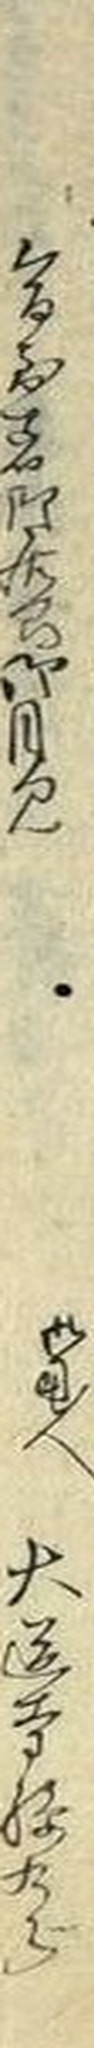今日到着御居間御目見御用人大道寺孫九郎
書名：少傅日録抄（斉承付側向頭取日記、在府）
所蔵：福井県文書館 Fukui Prefectural Archives
